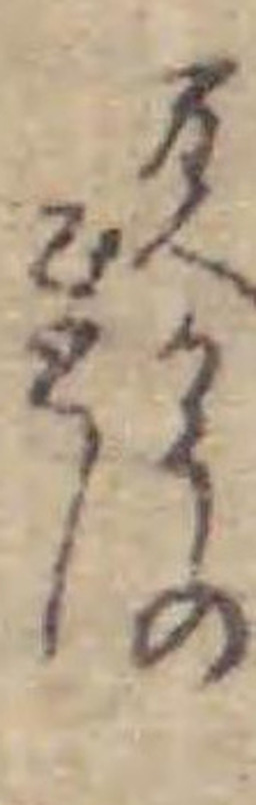ごとし

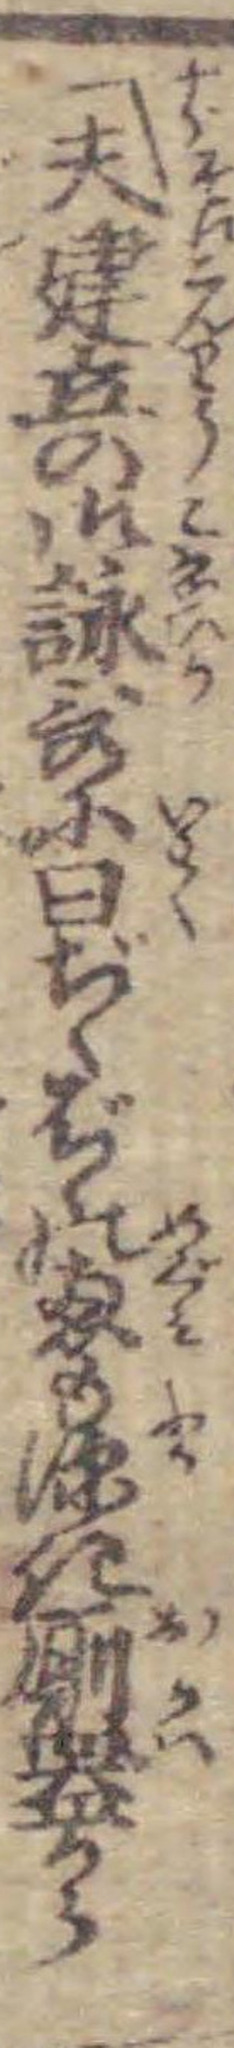〽夫建立の御詠歌に曰ぢゝばゝの恵も深き厠器から
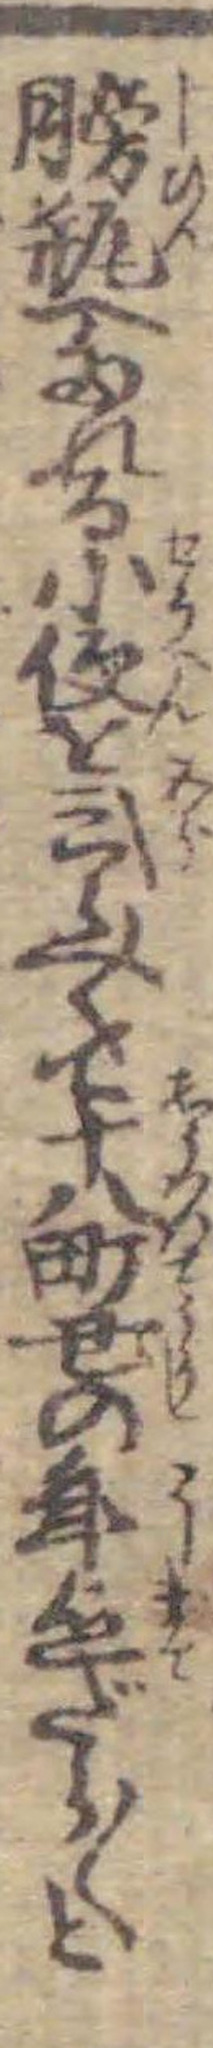膀瓶へたれる小便を〽こらへ〳〵て十八町丑の年迄だら〳〵と
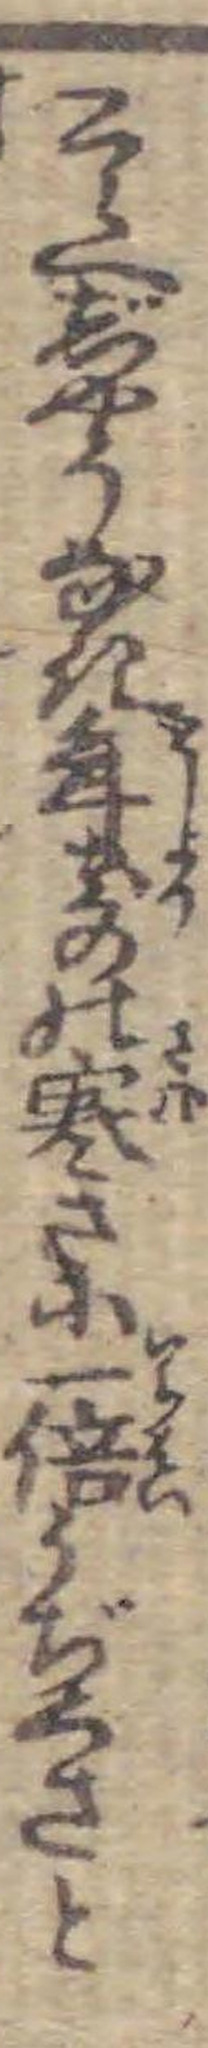こらへじやうなき年寄の寒さに一倍うぢくさと
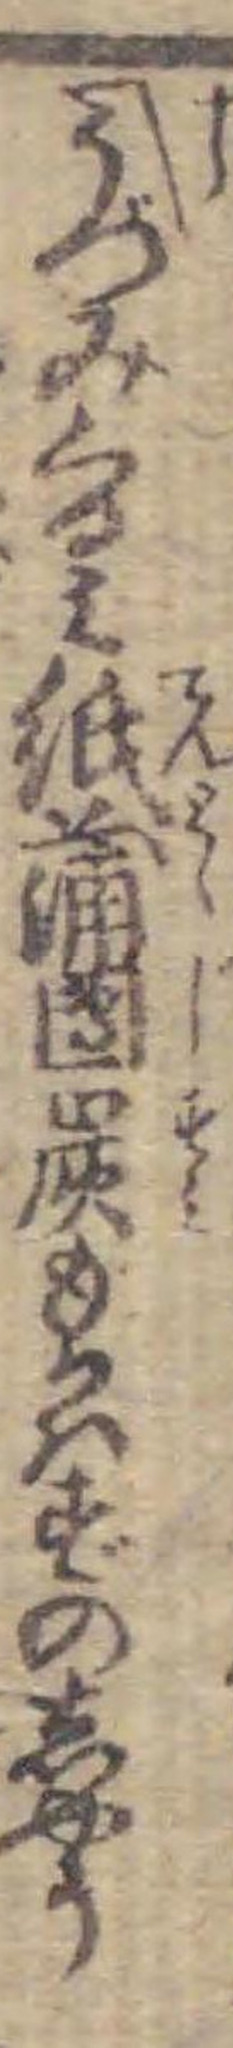〽うづみくるみ紙蒲団炭もかはずのしやう
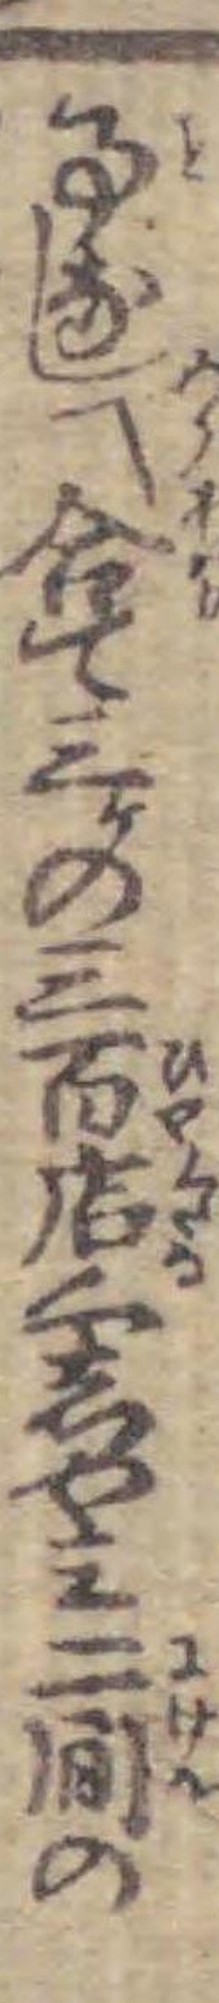事なし〽合て三三百店くしやみ二間の
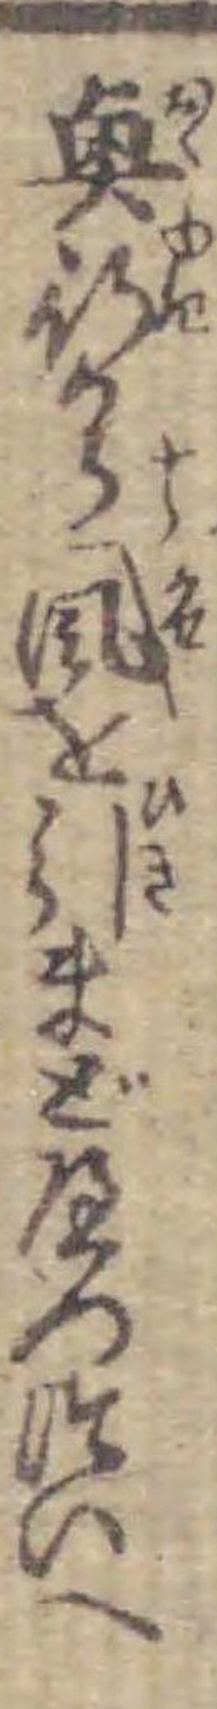奥行から〽風を引まどへつついへ
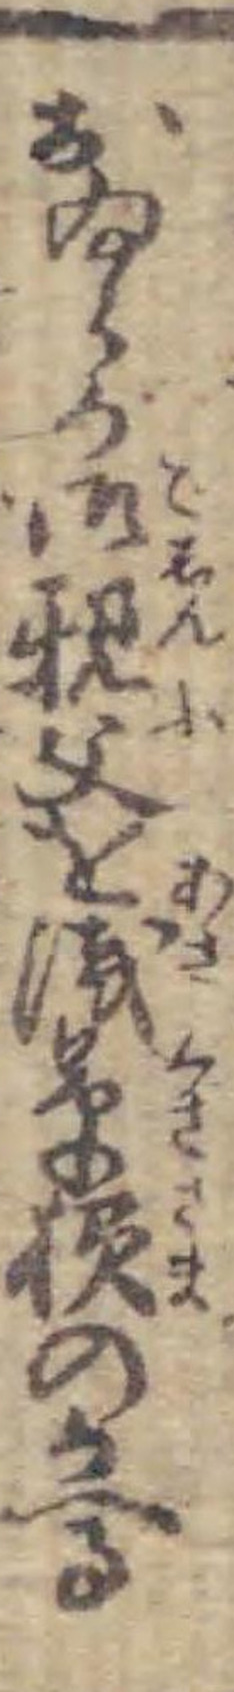おゐらが御親父を浅草様のかへる
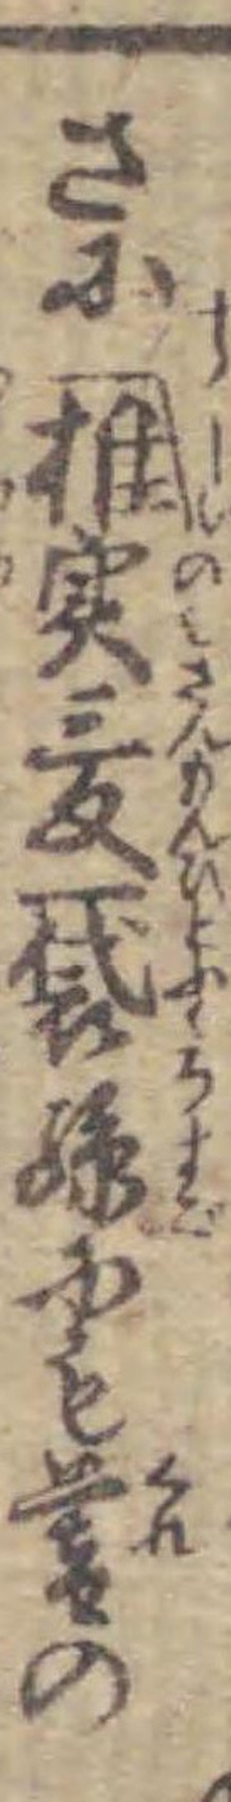さに〽椎実三匁一袋孫にも暮の
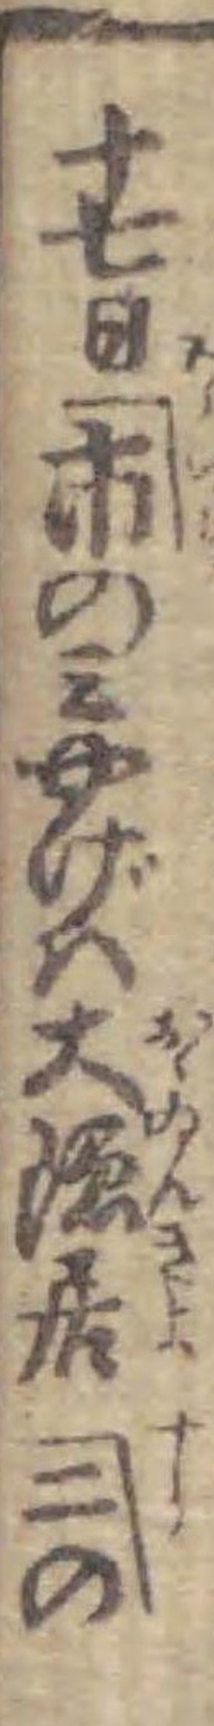十七日〽市のみやげは大隠居〽二の
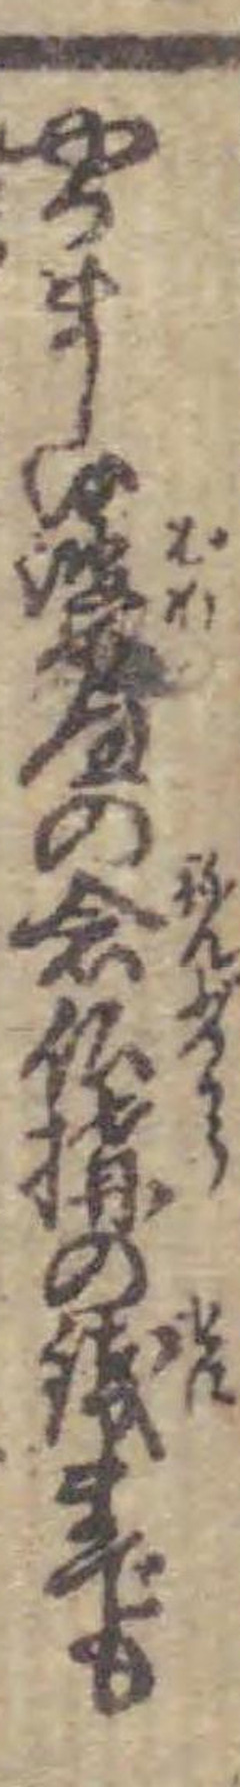やかましい婆への念仏構の銭までも
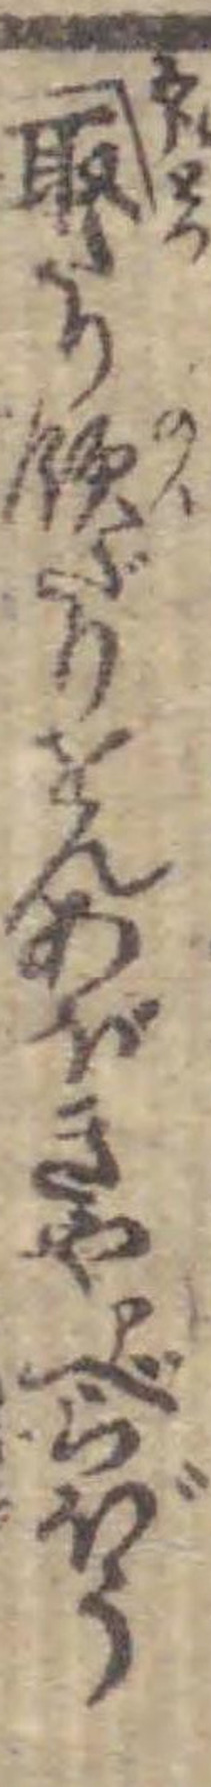〽取たり飲だりをんあぼきや
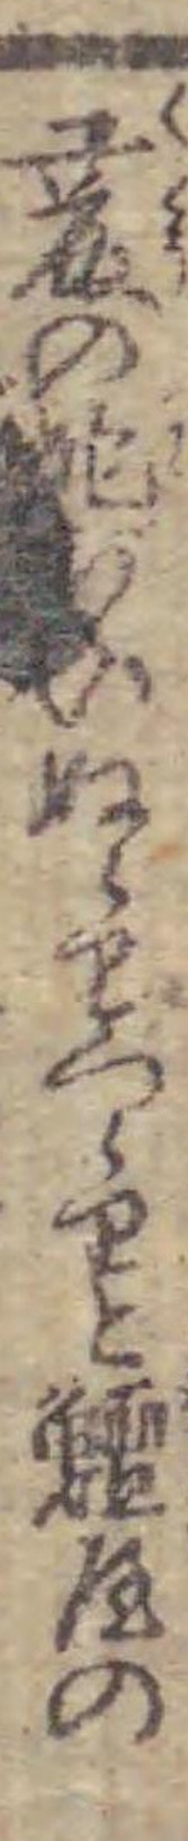工藤の蛇ぢいぬらりくらりと鱣屋の
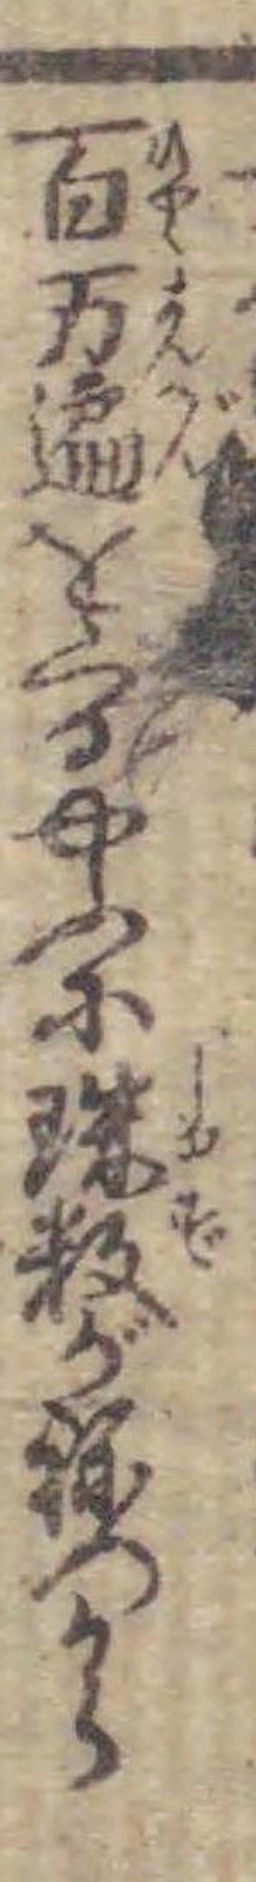百万遍をくるやふに珠数がねつから
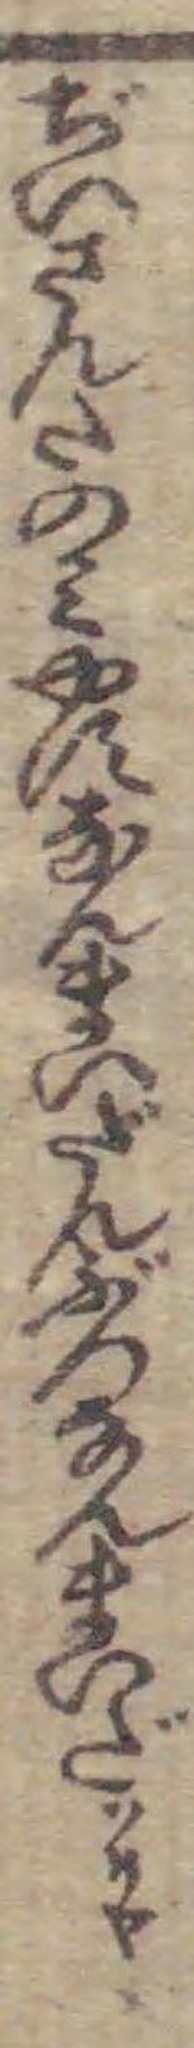ぢいさんたのみやすなんまいだんぶつなんまいだ
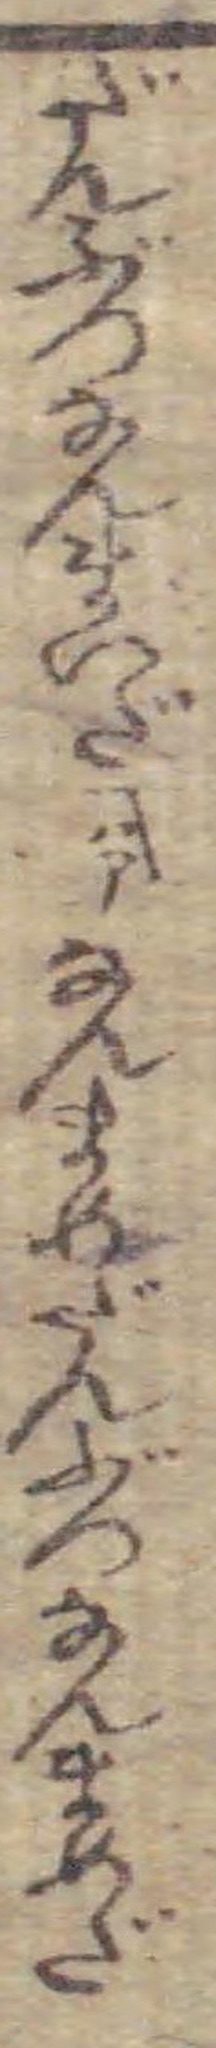だんぶつなんまいだ〽ハアなんまめだんぶつなんまめだ
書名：年寄之冷水曽我 : 3巻
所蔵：国立国会図書館 National Diet Library, JAPAN
